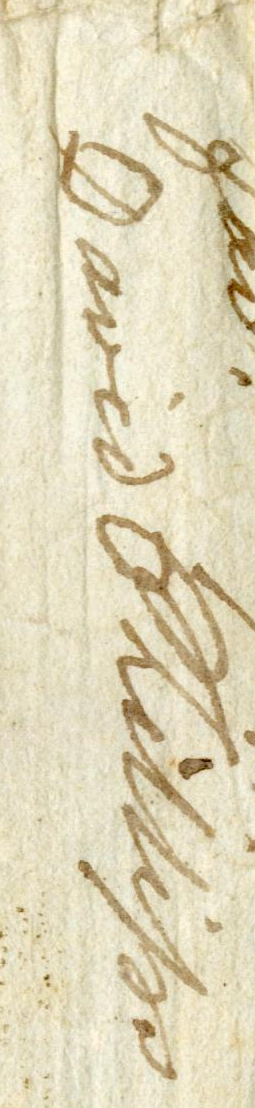David Phillips
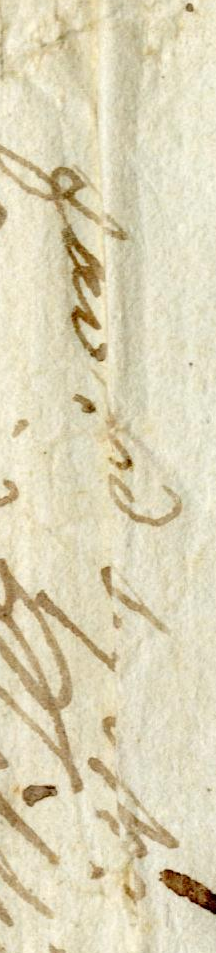far^d by
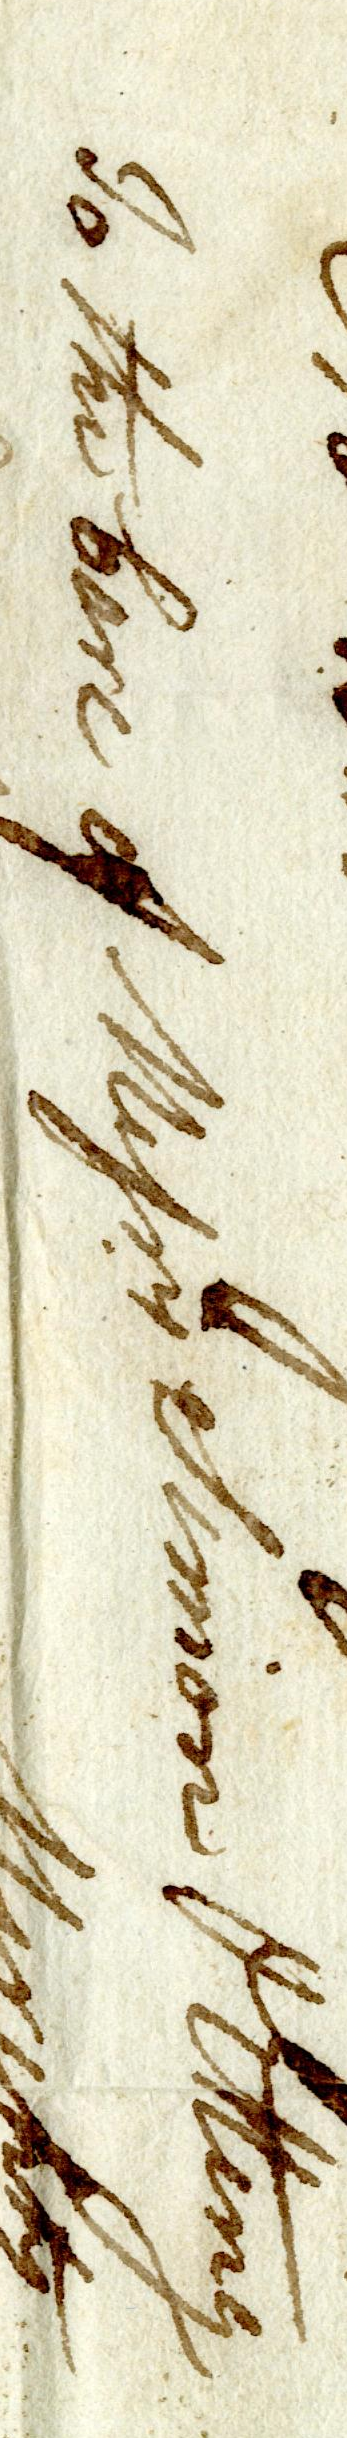To the Care of Mess^rs. Simon & Etting
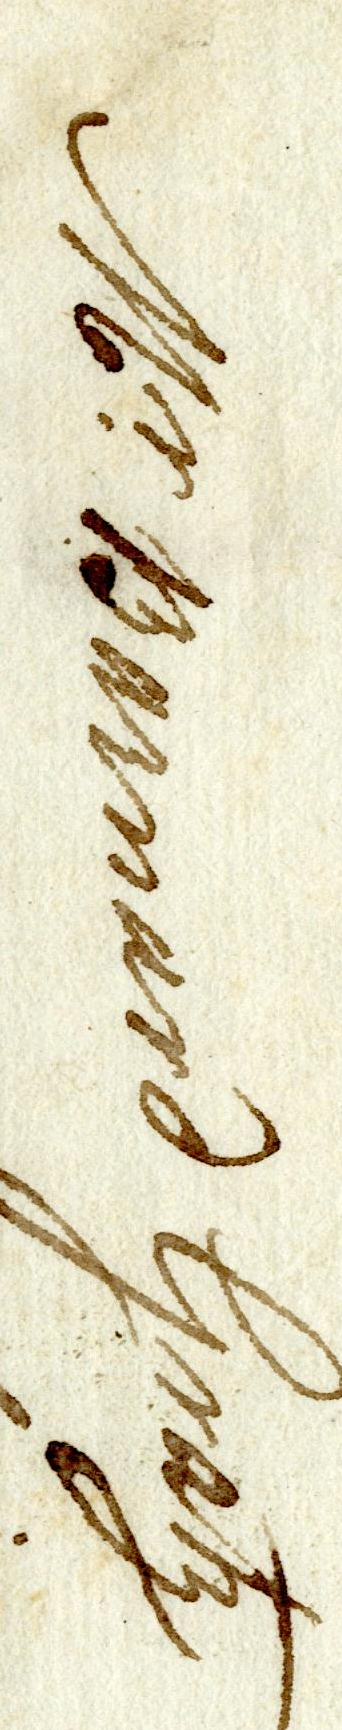M^r. Barnard Gratz
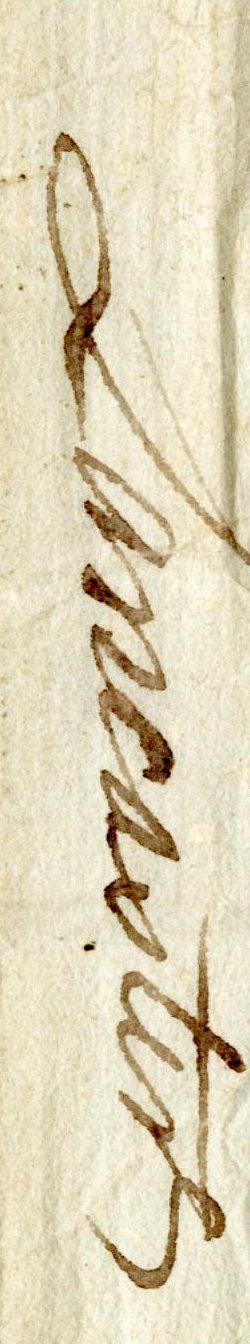Lancaster
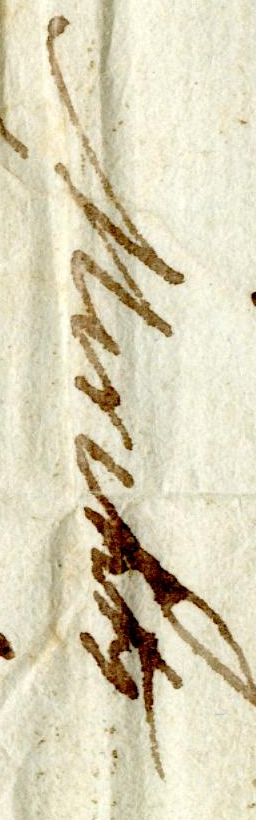Merch^t
